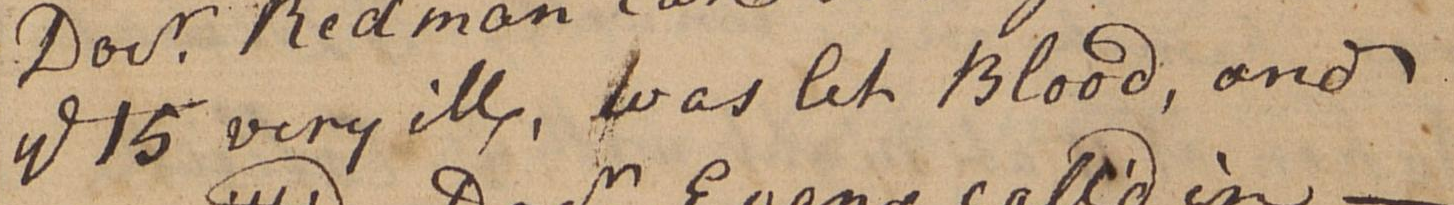y^e 15 very ill, was let Blood, and
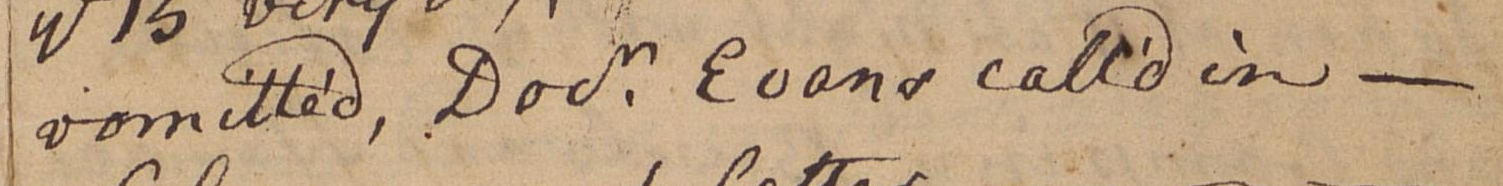vomitte'd, Doc^r Evans call'd in-
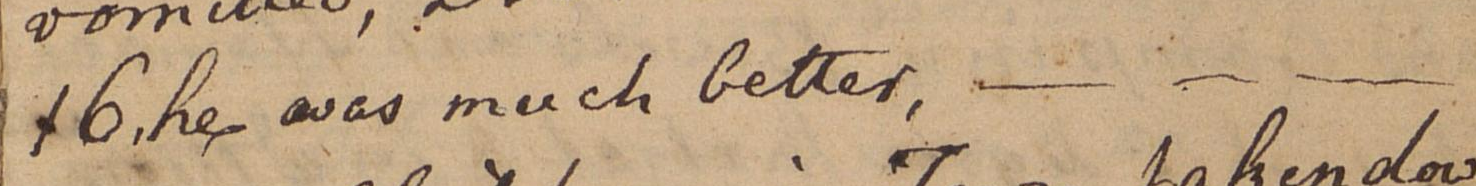16, he was much better,-
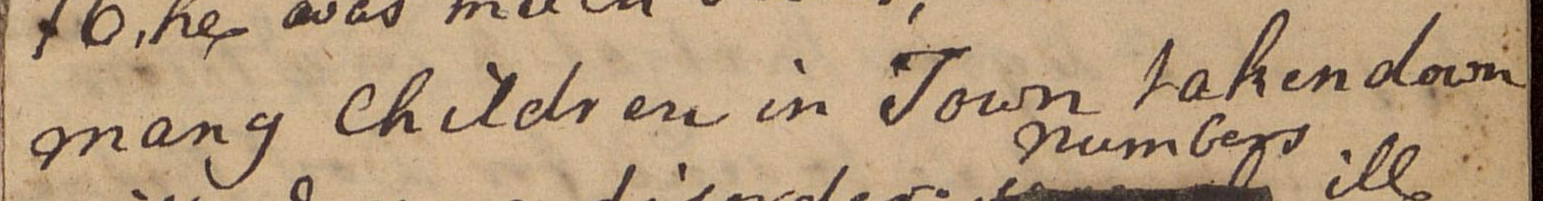many Children in Town taken down
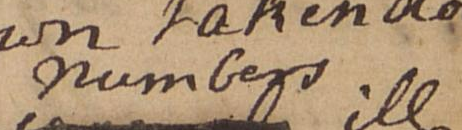numbers
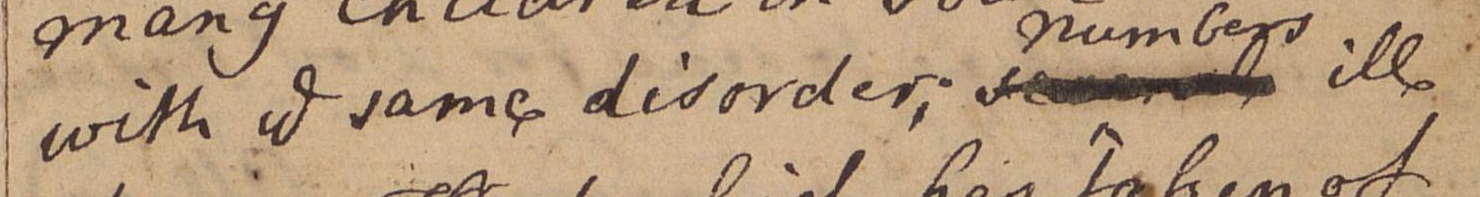with y^e same disorder; ^ [several] ill
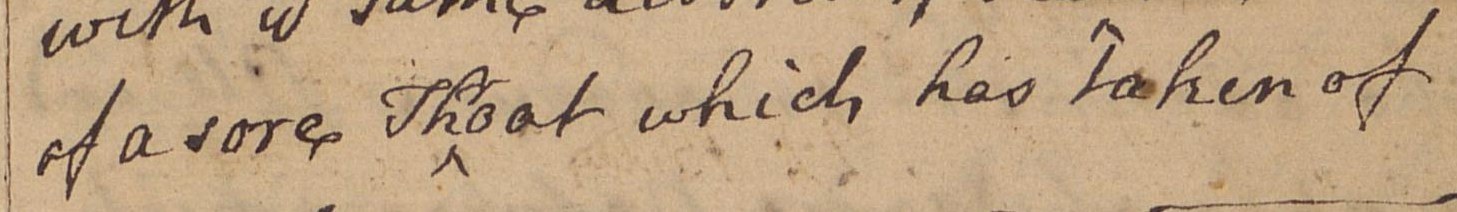of a sore Th^roat which has taken of
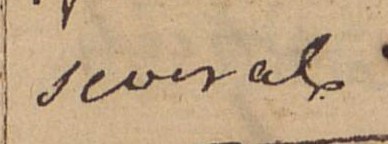several
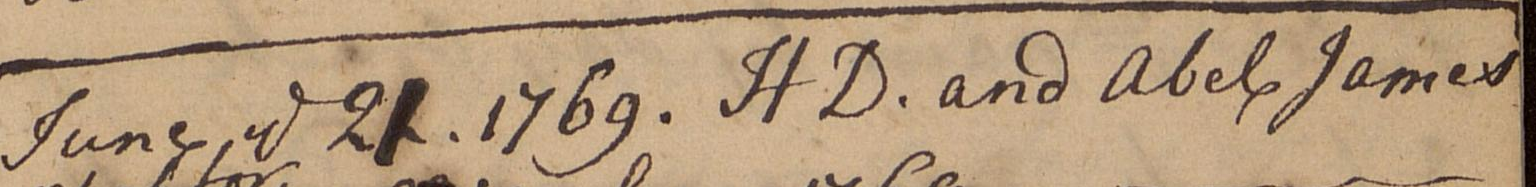June y^e 21. 1769. H D. and Abel James
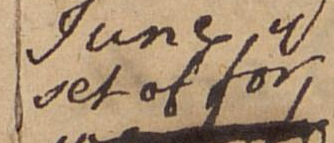set of for
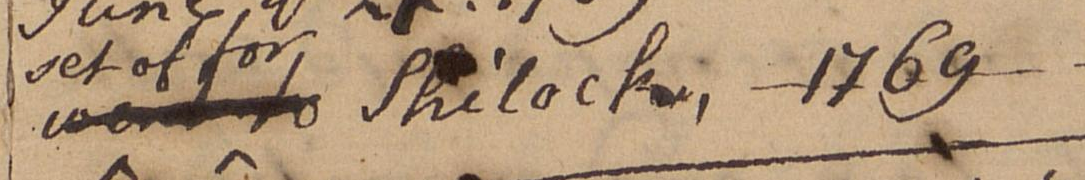[went to] Shilock, 1769
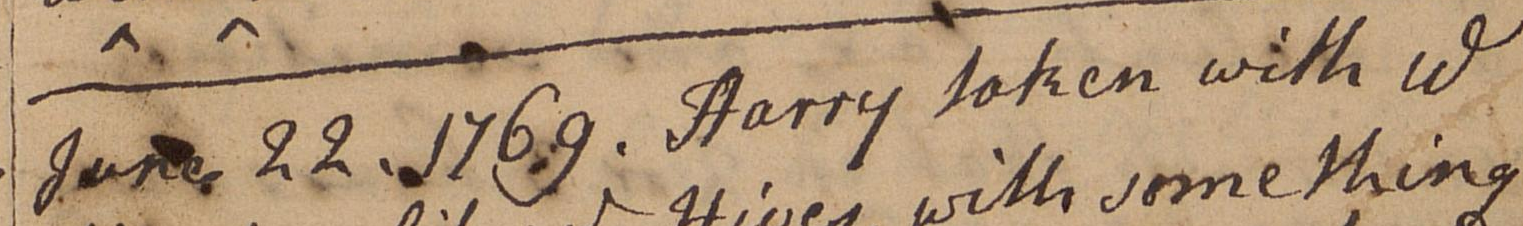June 22. 1769. Harry taken with y^e
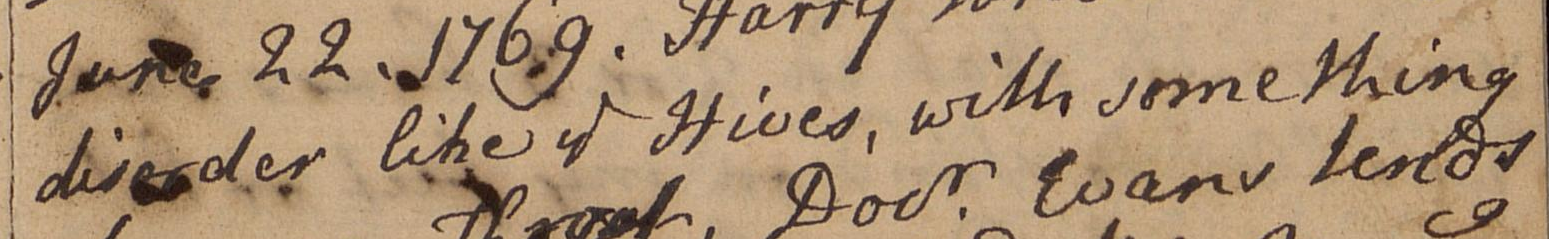disorder like y^e Hives, with something
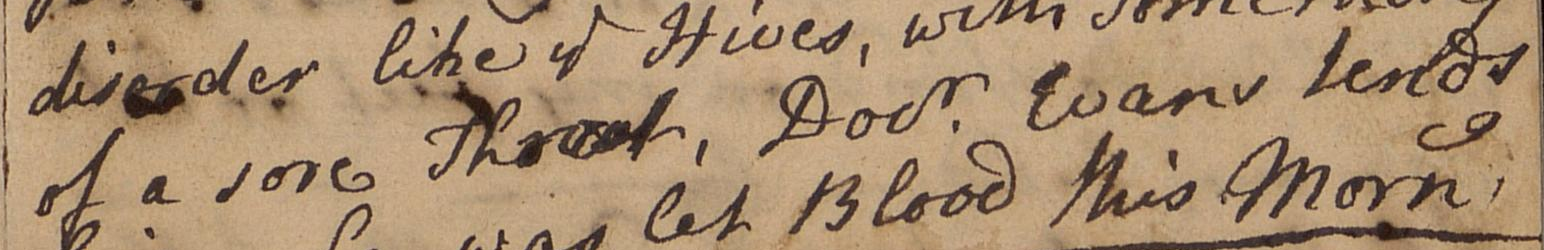of a sore Throat, Doc^r. Evans tends
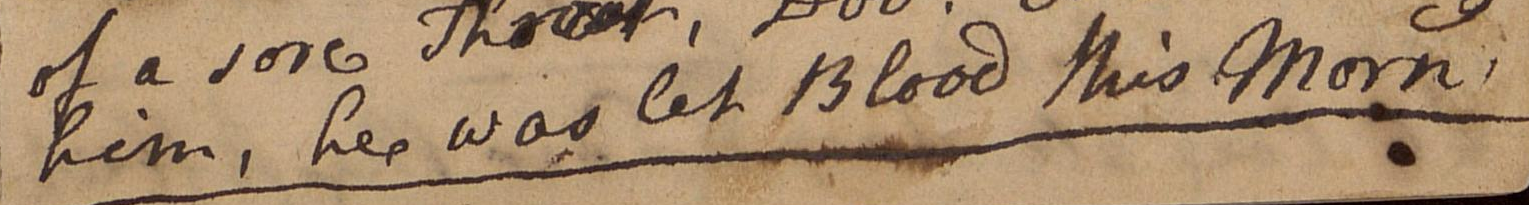him, he was let Blood this Morn^g
